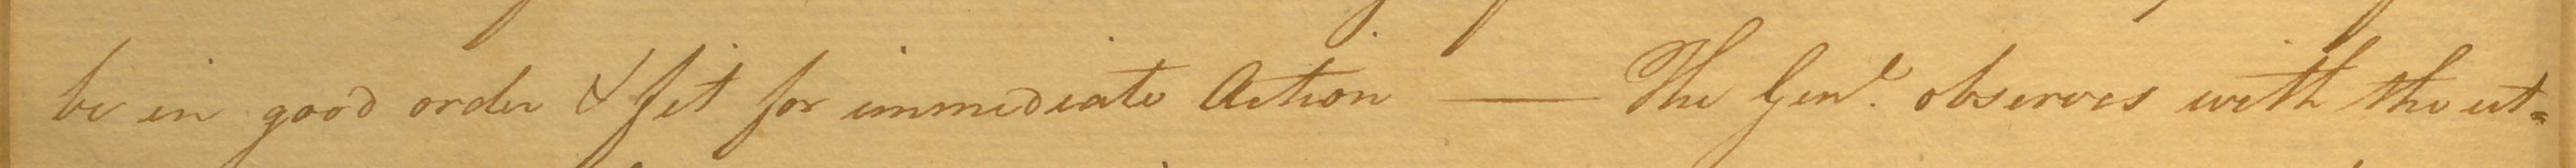be in good order & fit for immediate Action- The Gen^l. observes with the ut-
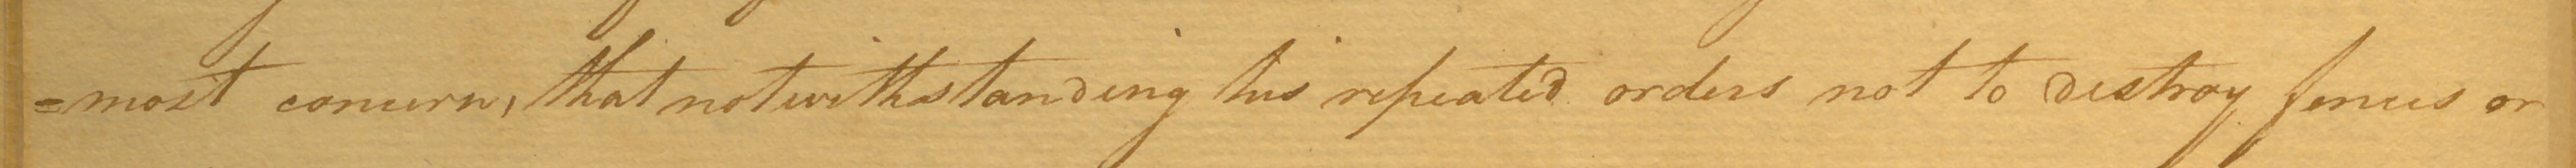-most concern, that notwithstanding his repeated orders not to destroy forces or
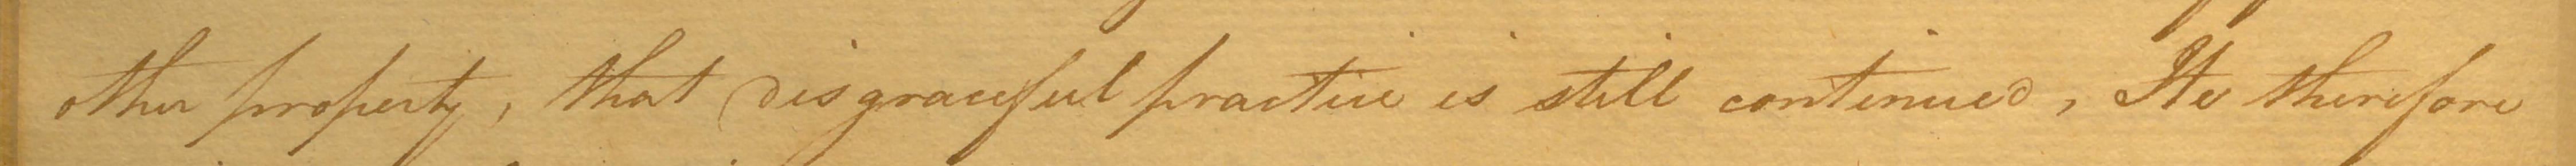other property, that disgraceful practice is still continued, He therefore
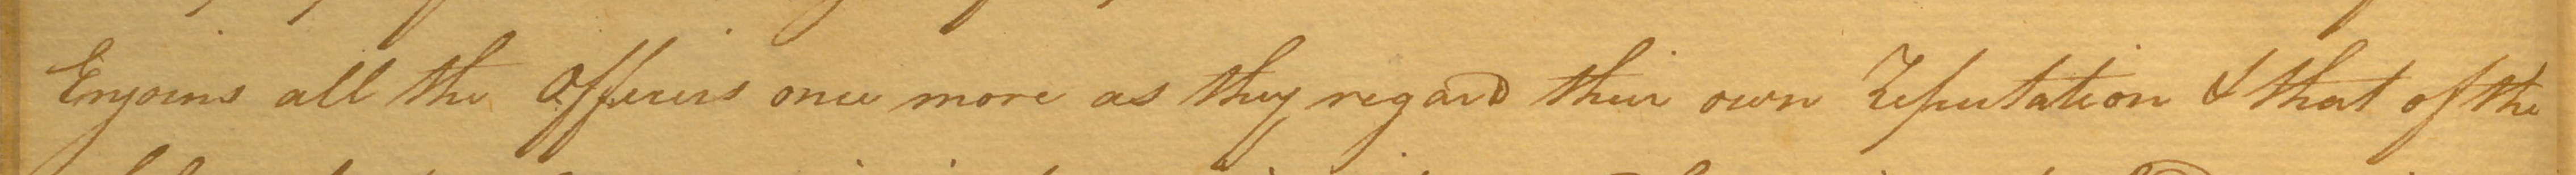Enjoins all the Officers once more as they regard their own Reputation & that of the
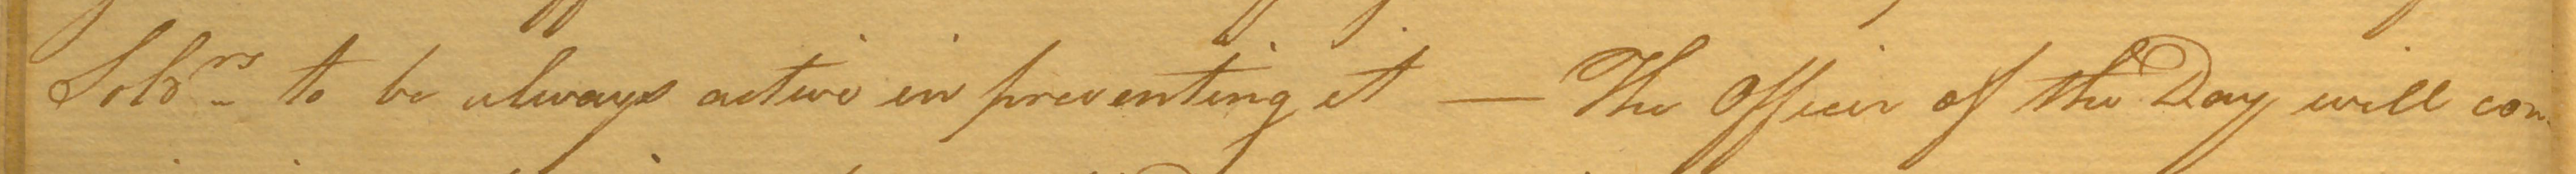Sold^rs. to be always active in preventing in- The Officer of the Day will con
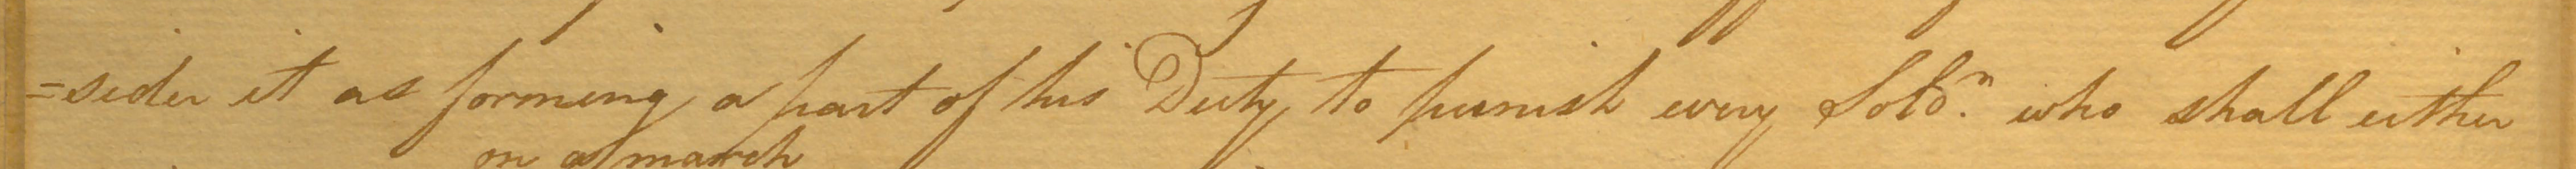-sider it as forming a part of his Duty to furnish every Sold^r. who shall either
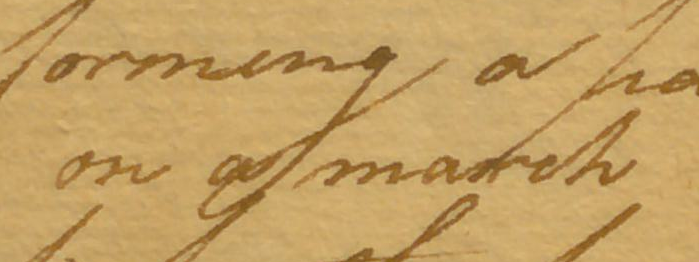on a march
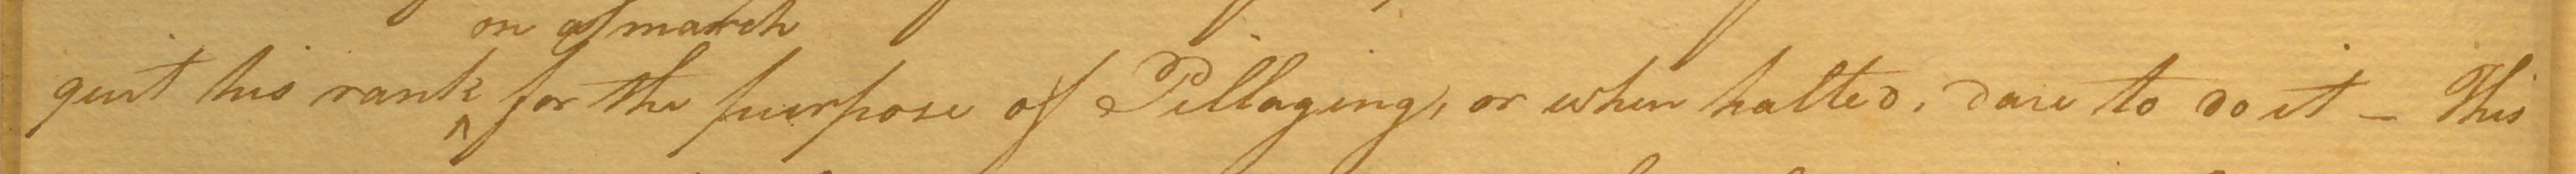quit his rank ^ for the purpose of Pillagings or when halted, dare to do it- This
